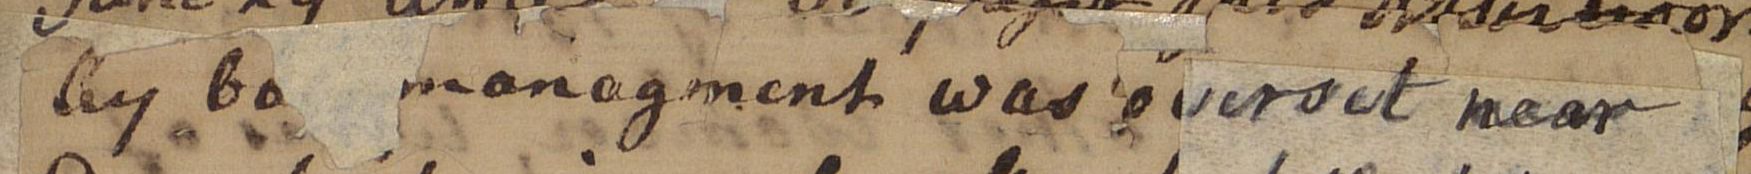by bo managment was overset near
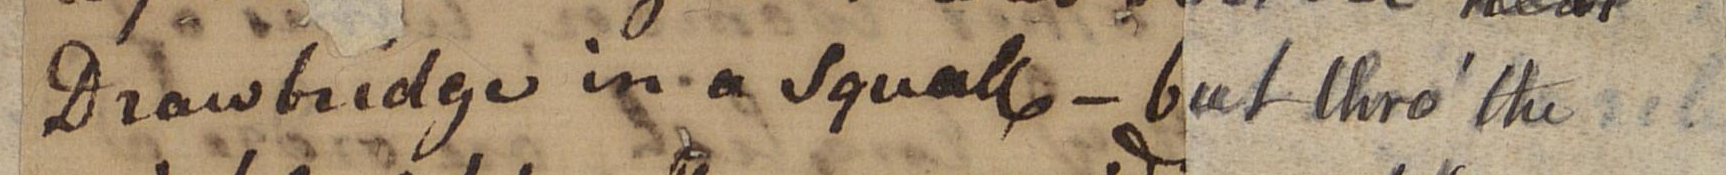Drawbridge in a Squall- but thro' the
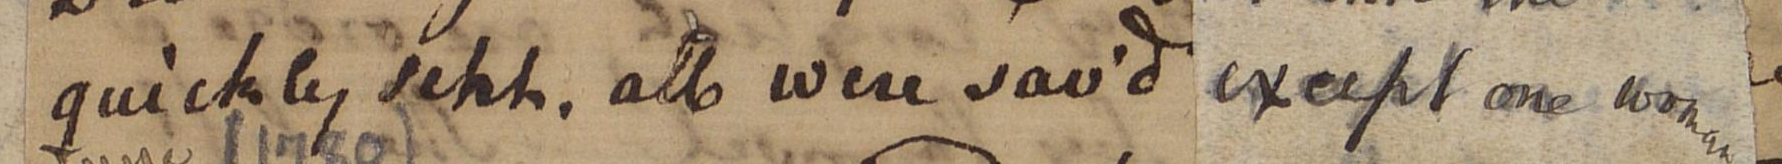quickly sekt, all were sav'd except one woman
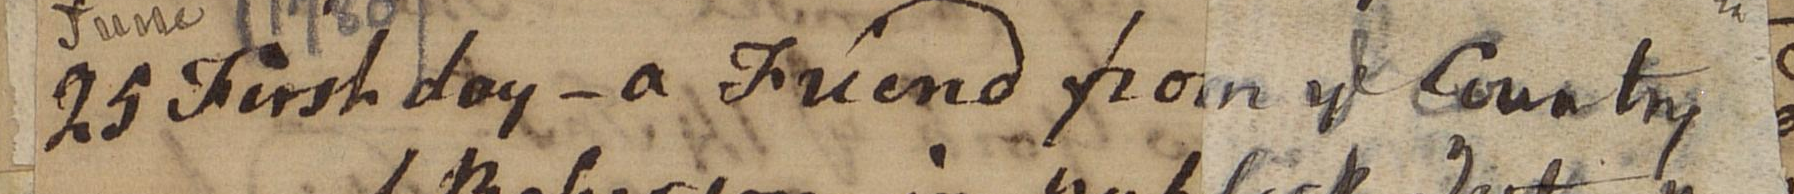25 First day- a Friend from y^e Country
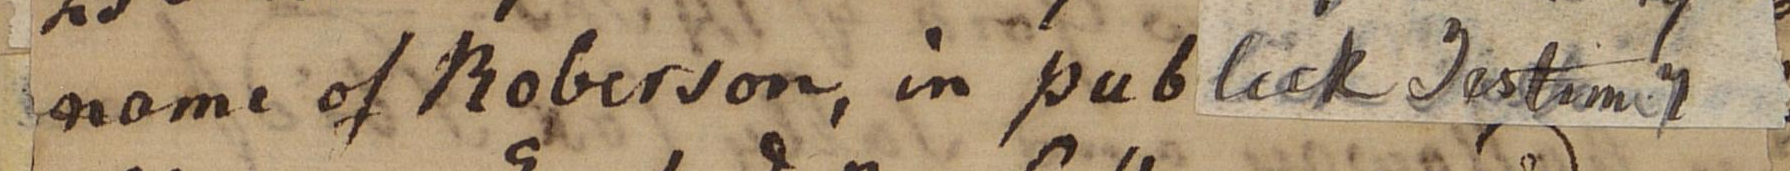name of Roberson, in publick Testim^y
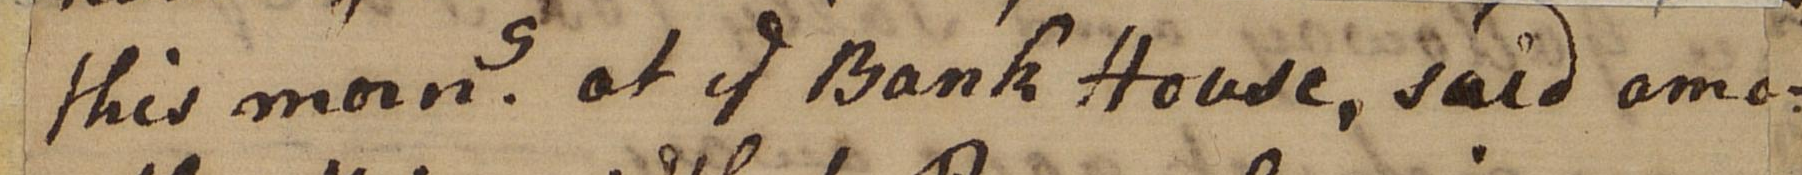this morn.^g at y^e Bank House, said amo
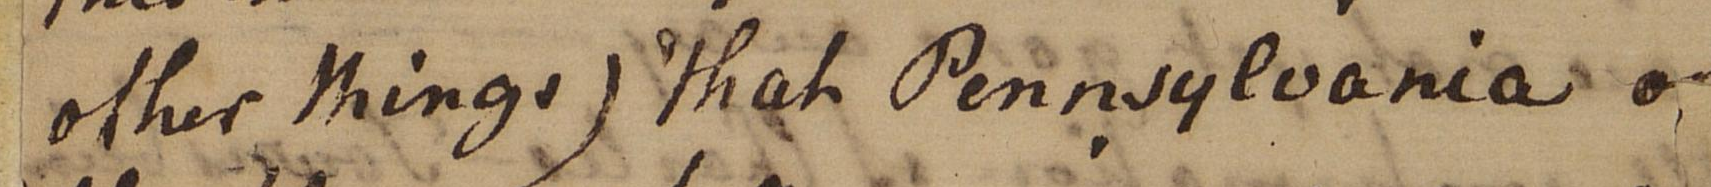other things) that Pennsylvania o
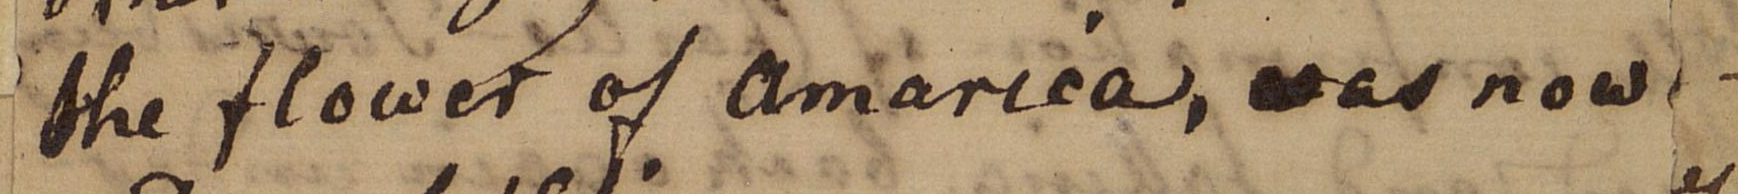the flower of Amarica, was now
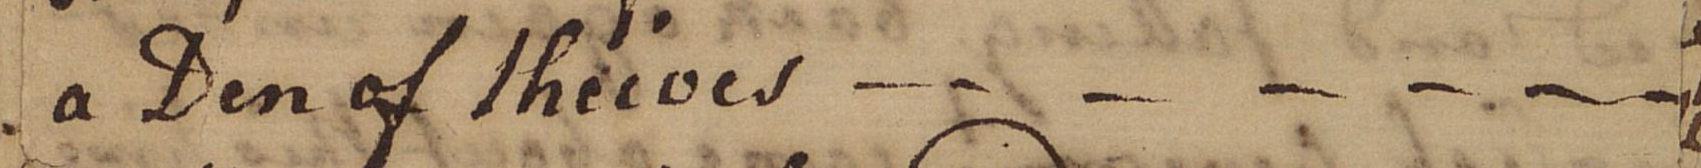a Den of theives------
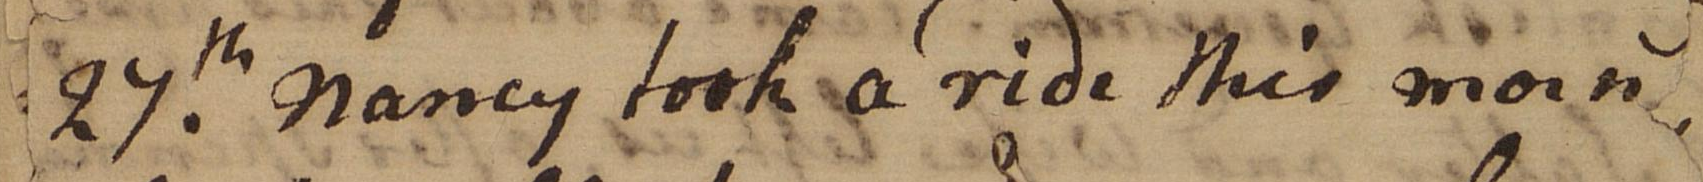27^th. Nancy took a ride this morn
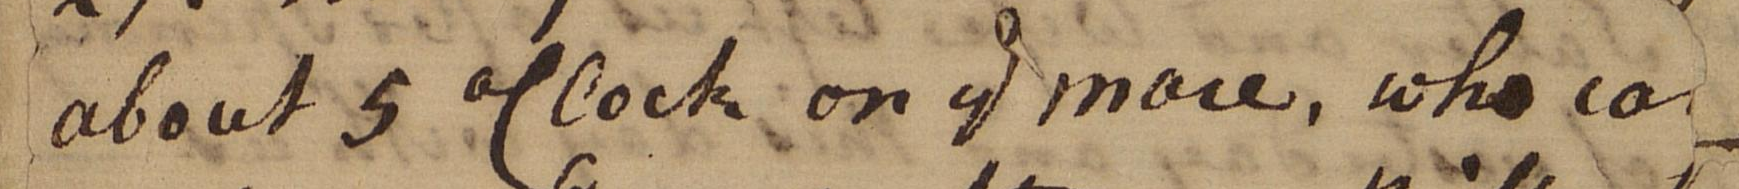about 5 ^o Clock on y^e mare, who ca
